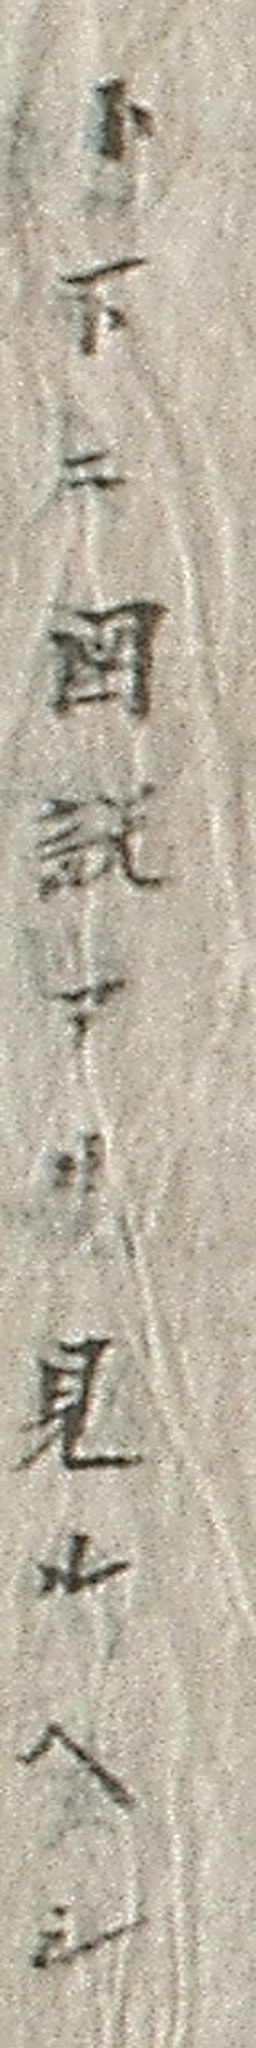ト下ニ図説アリ見ルヘシ

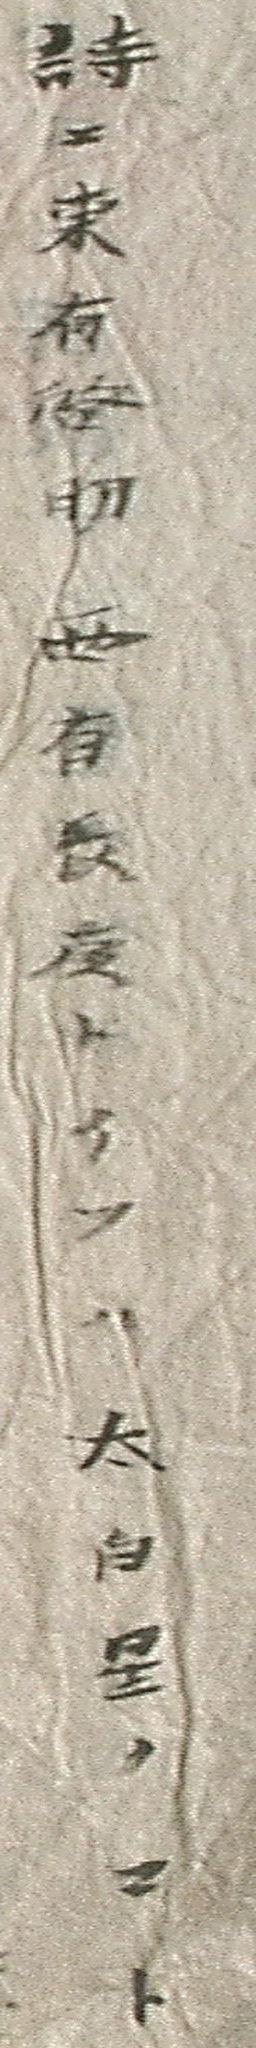詩ニ東有啓明西有長庚トイフハ太白星ノコト
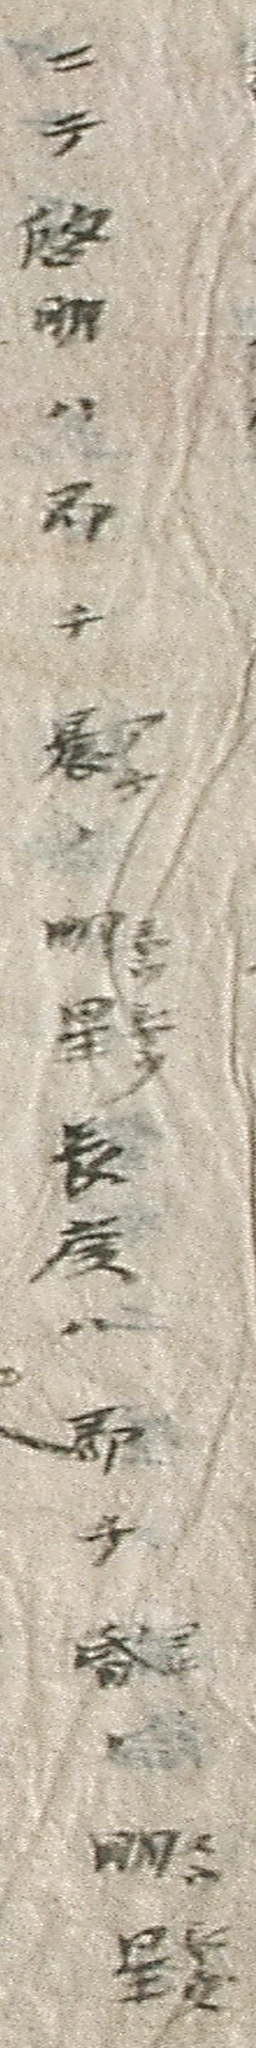ニテ啓明ハ名ヲ晨ノ明星長庚ハ即チ昏ノ明星
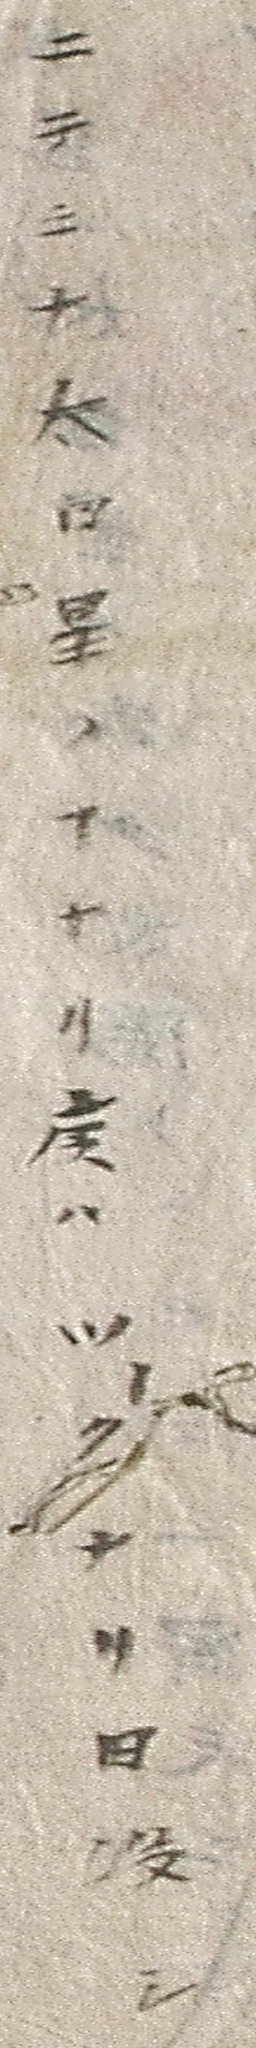ニテミナ太白星ノヿナリ庚ハツクナリ日没シ
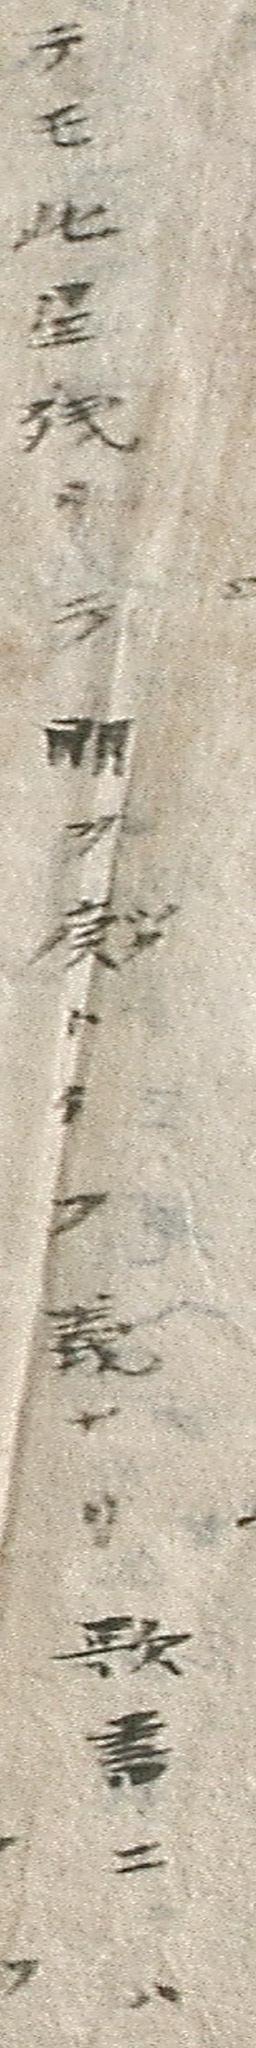テモ此星残リテ明ク庚トイフ義ナリ歌書ニハ
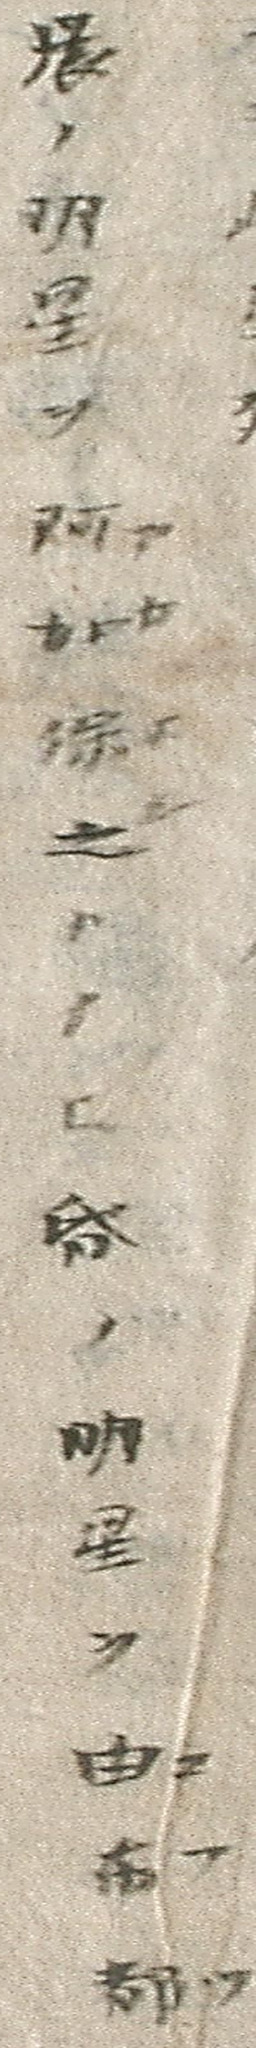晨ノ明星ヲ阿加保之トイヒ昏ノ明星ヲ由布都
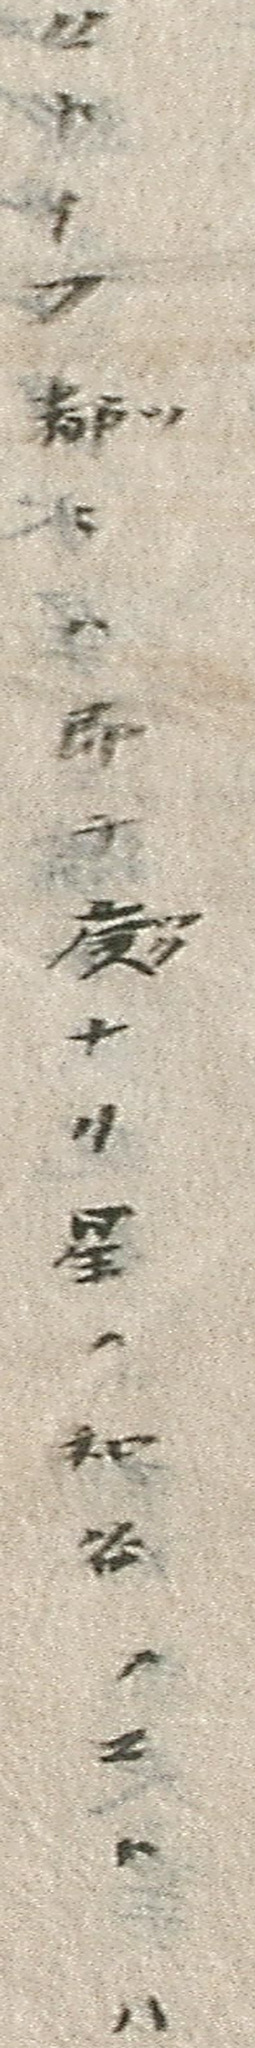々トイフ都トハ即チ庚ナリ星ノ和名ノコトハ
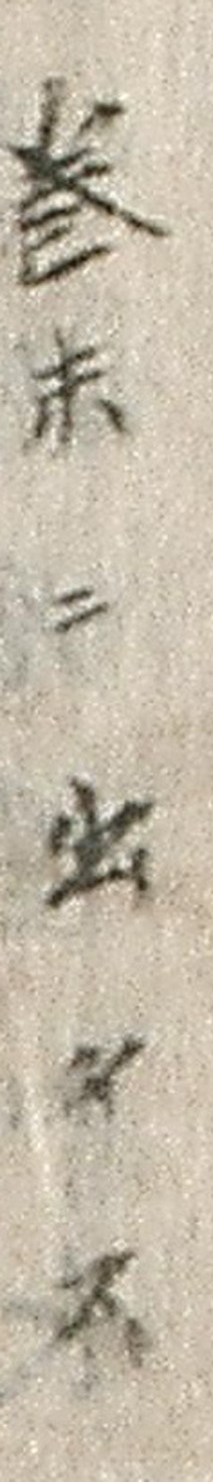巻末に出タス
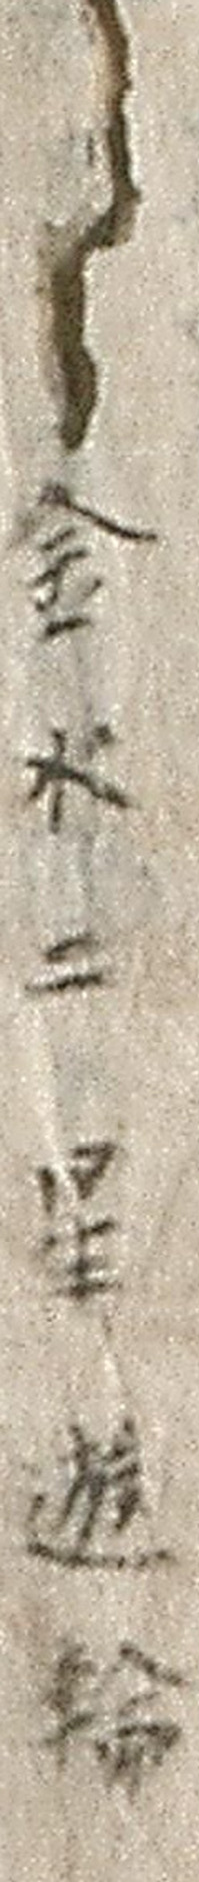金水ニ星遊輪
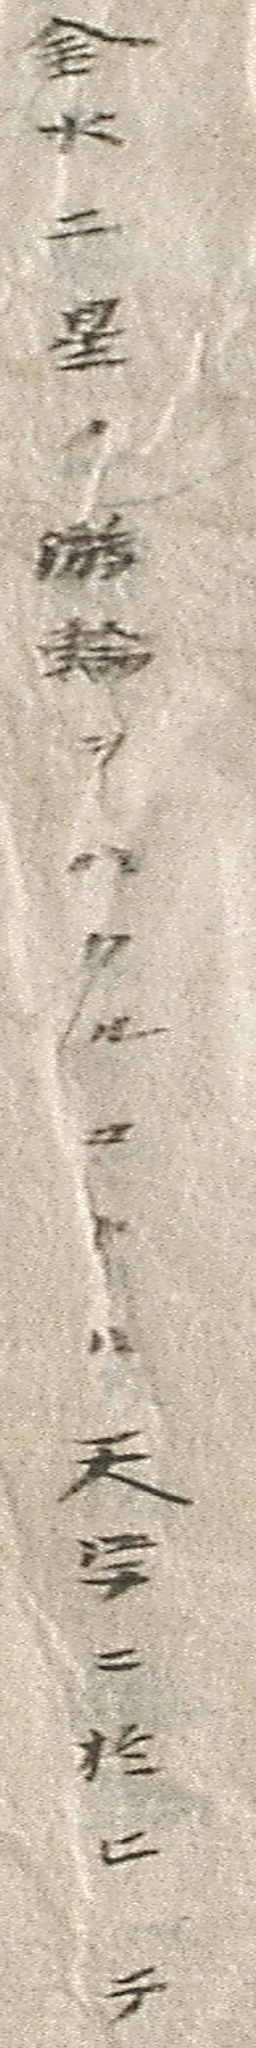金水ニ星ノ游輪ヲハカルコトハ天学ニ於ヒテ
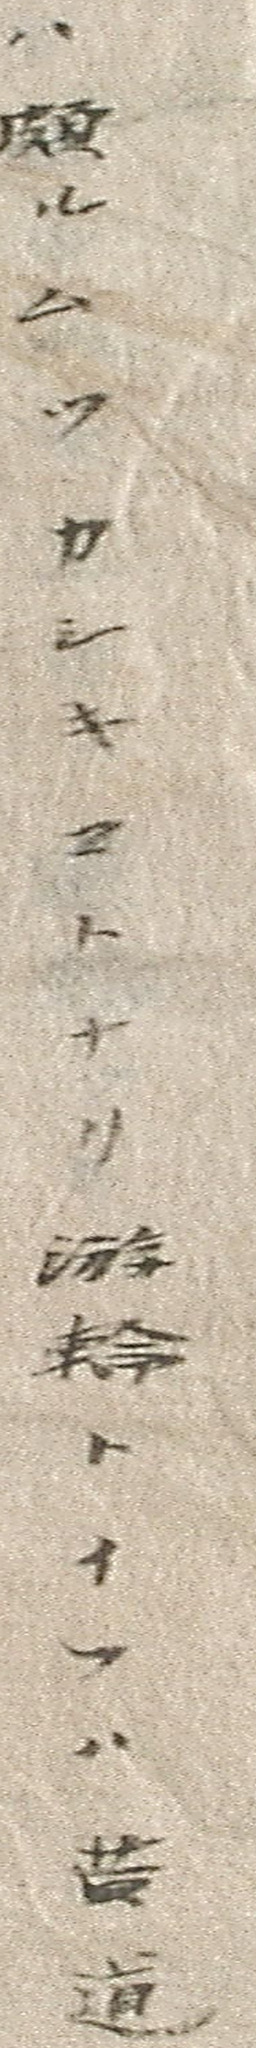ハ頗ルムツカシキコトナリ游輪トイフハ黄道
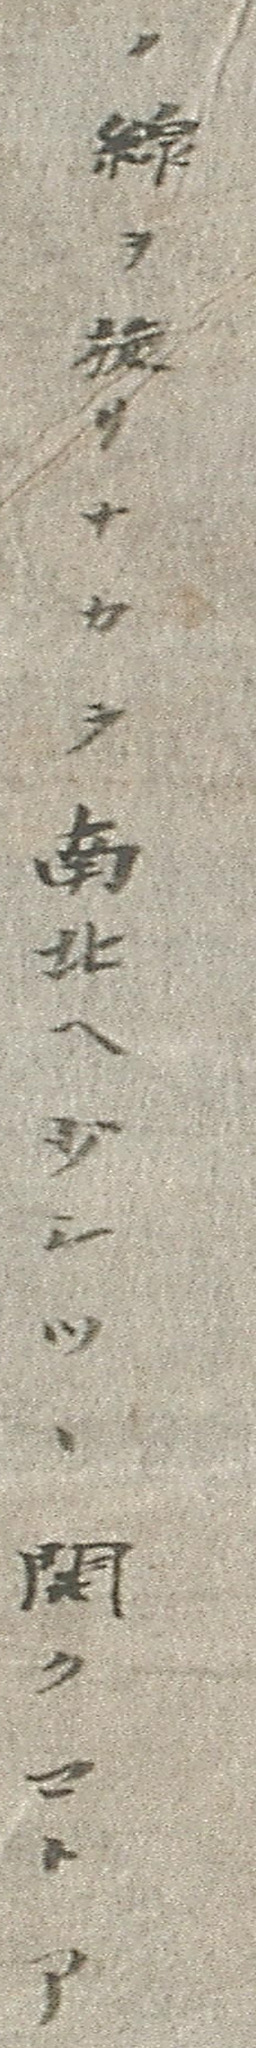ノ線ヲ旋リナカラ南北ヘ少シツヽ開クコトア
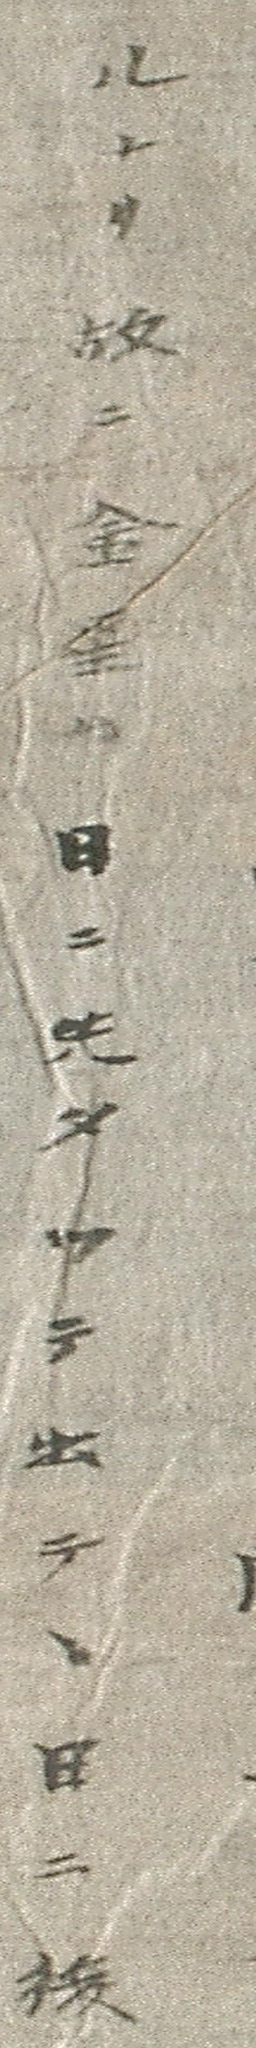ルナリ故ニ金星ハ日ニ先タツテ出テヽ日ニ後
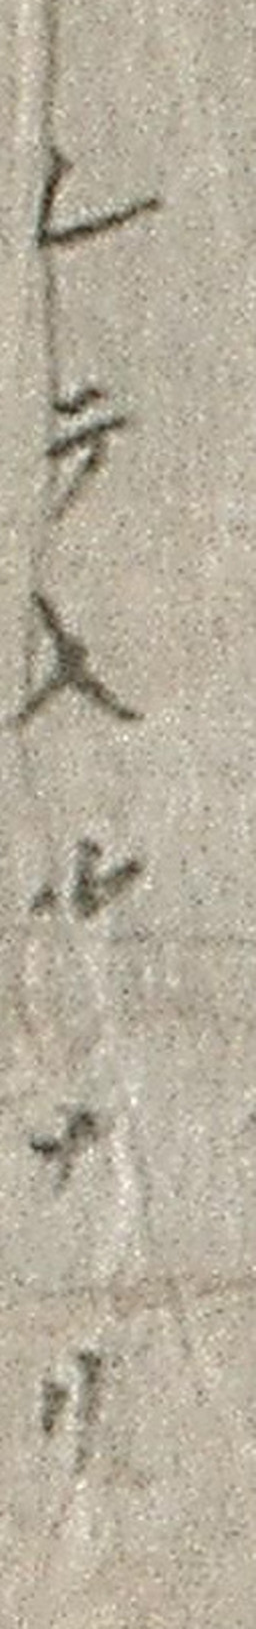レテ入ルナリ
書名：天學便蒙図説
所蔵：東京大学地震研究所図書室 Earthquake Research Institute Library, The University of Tokyo, JAPAN
